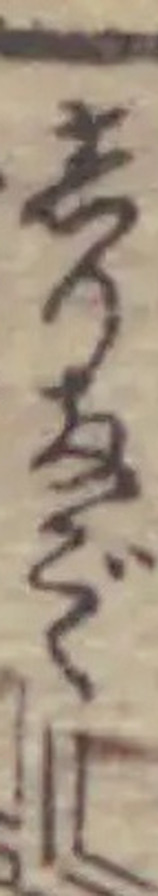しり両ごく
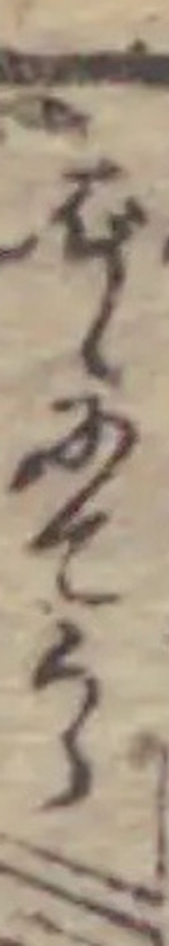ばしにてうら
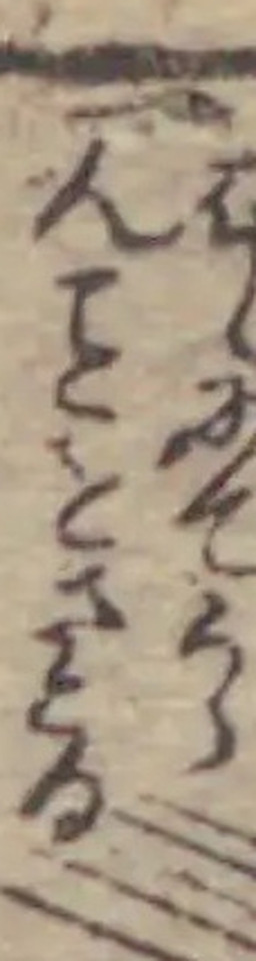んことをさとる
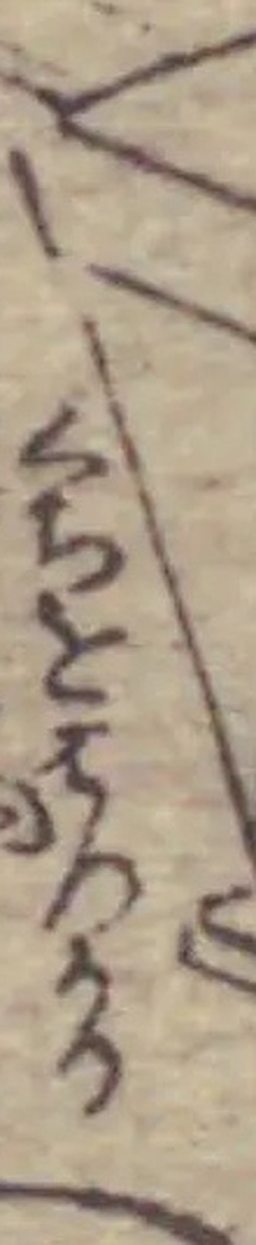くちをはつかり
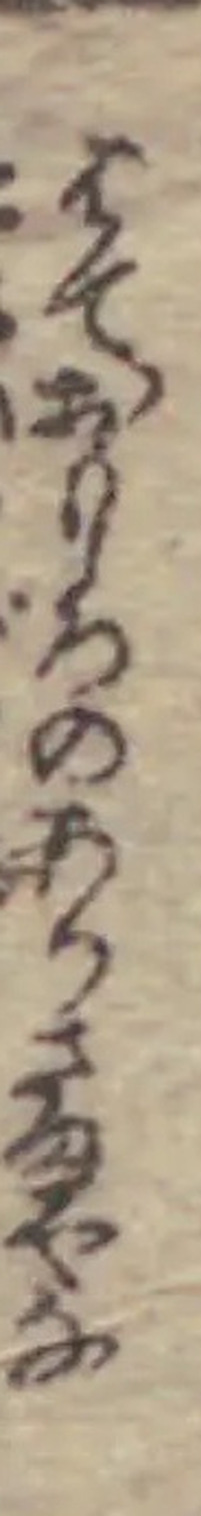はておもしろのありさまやな
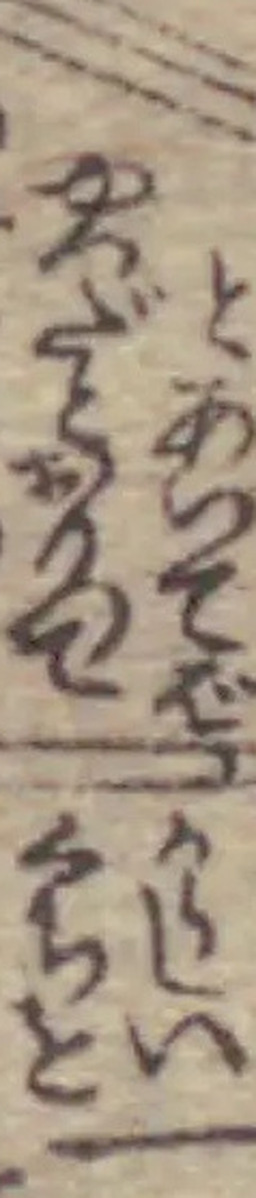やつだとおもつてくちを
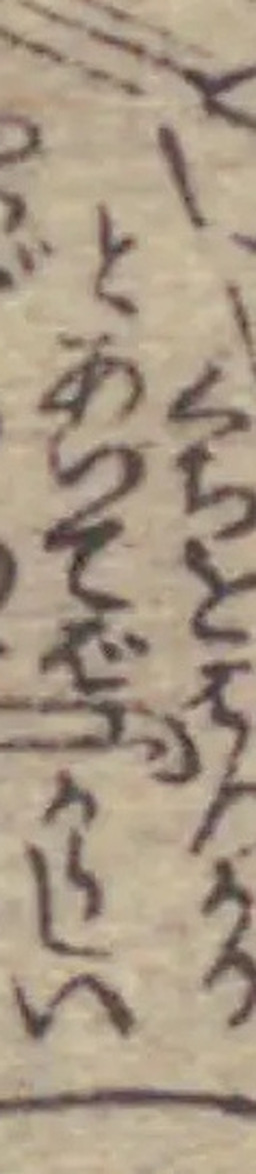とあいてばからしい
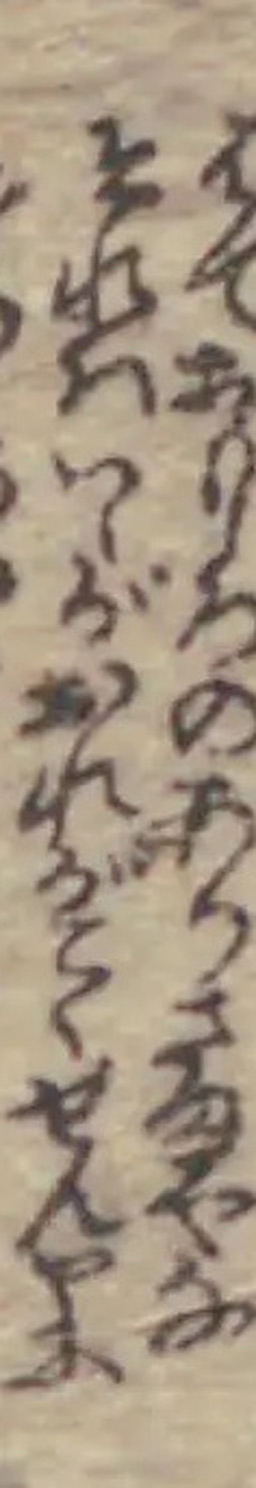それはいゝがおれがこゝせんやに
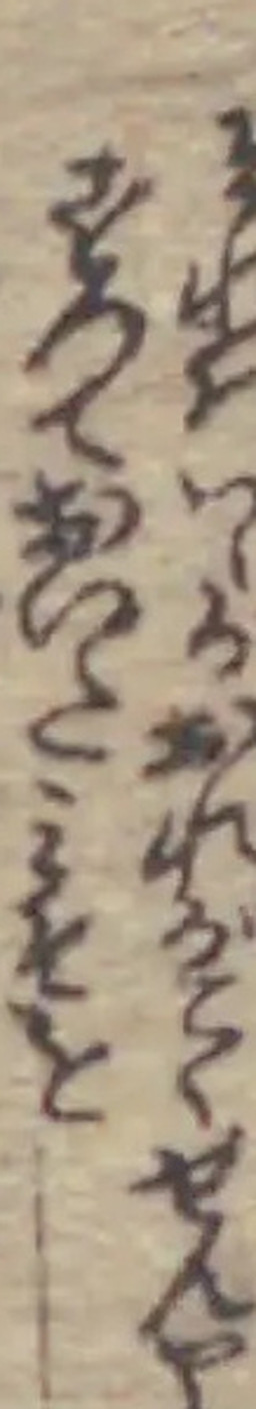すつておいたみそを
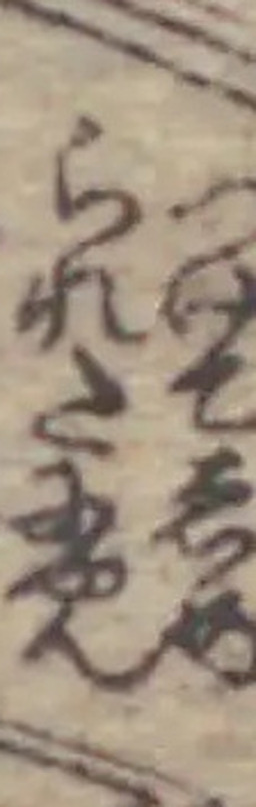られたにやん
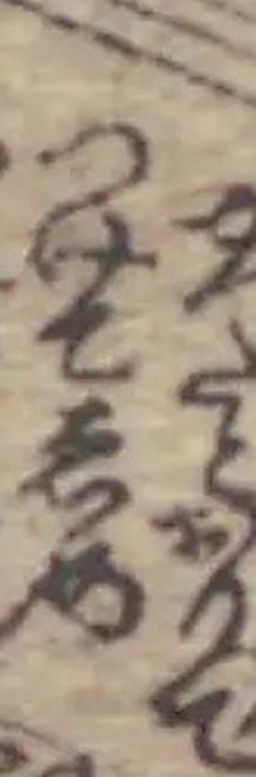つけてしめ
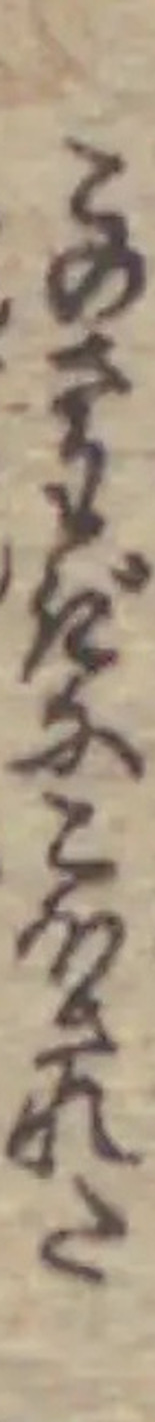このさわぎにこほされた
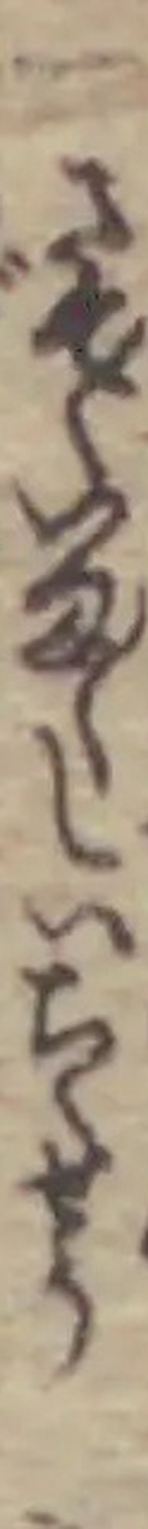さて〳〵いま〳〵しいちくせう
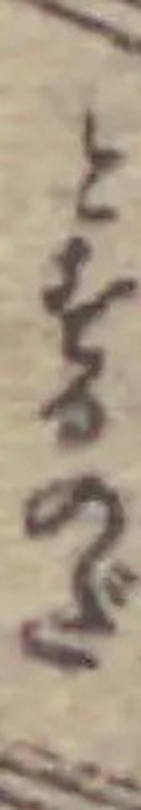とするのだ
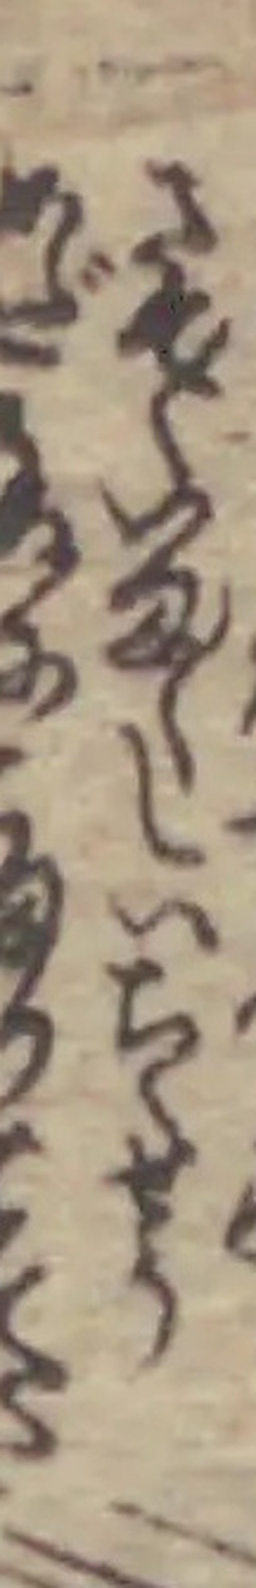めだうぬにこまりはてた
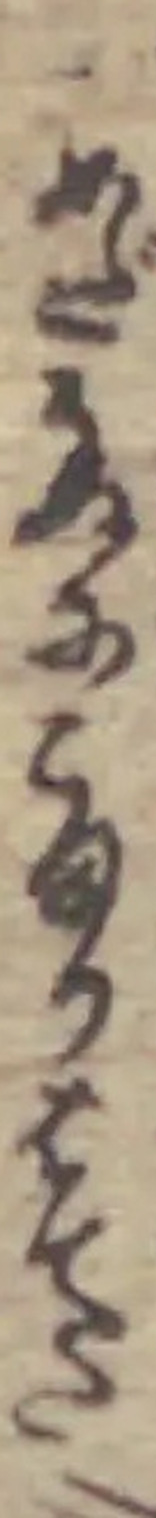めだうぬにこまりはてた
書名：冷水灰毛猫 2巻
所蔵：国立国会図書館 National Diet Library, JAPAN
